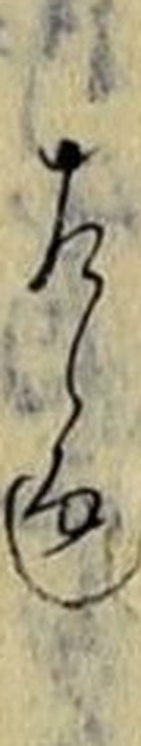左之通
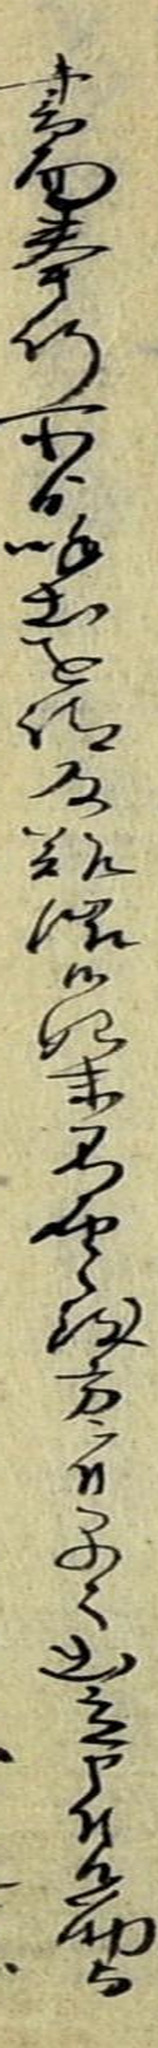書面奉行所ゟ呼出を請及難渋候始末不届之致方に付早々出立申付候筋と
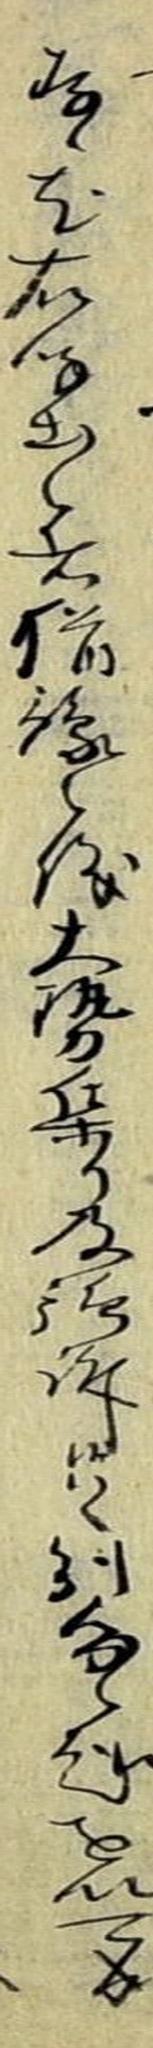存候尤右呼出候者猶豫之儀大勢集り及強訴候はヽ別紙之趣を以可成
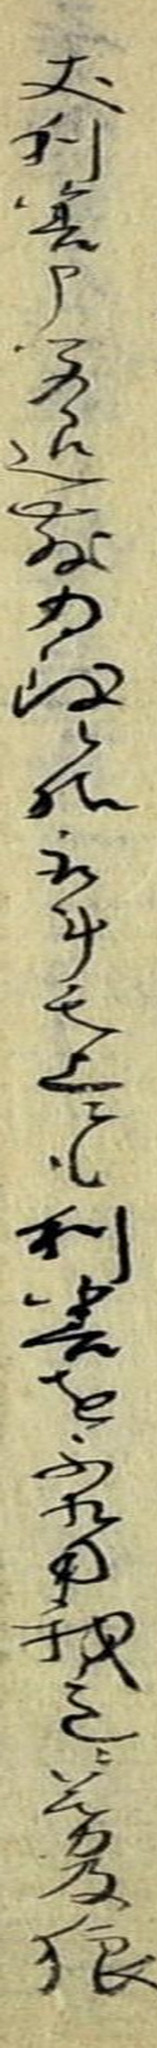丈利害申聞退散為致候様取斗其上にも利害を不相用我意に募及狼
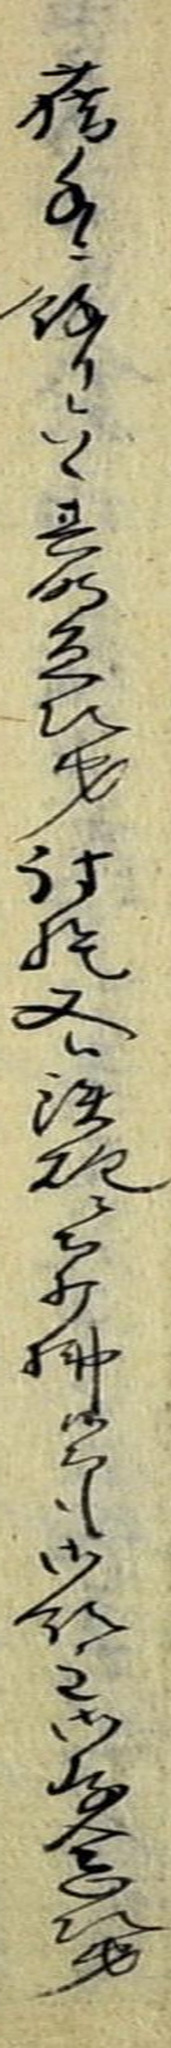藉手に餘り候はヽ其時宜次第討縄又は鉄砲に而打払候而も御領主御存念次第
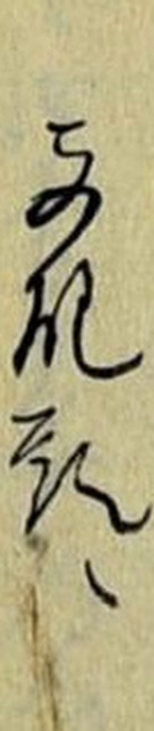支配頭へ
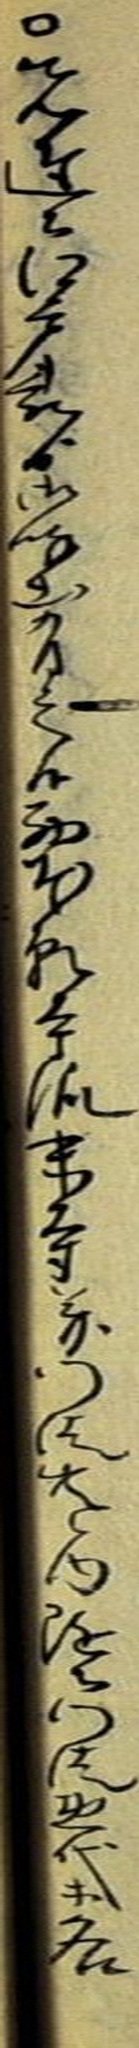○先達而江戸表ゟ御呼出有之候西本願寺派末寺并門徒共之内随而門徒惣代等各
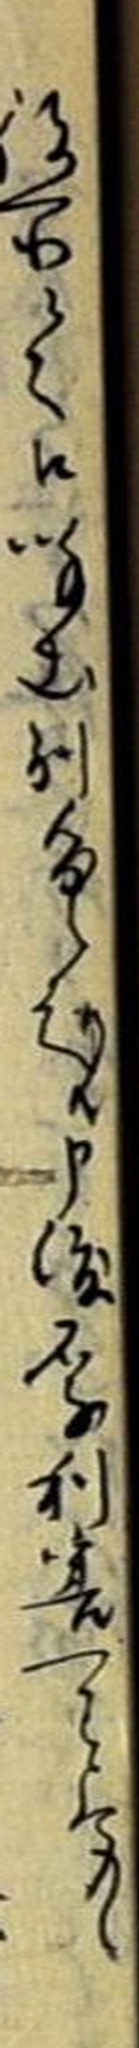役所〳〵江呼出別紙之趣被申渡厚利害可被申聞候
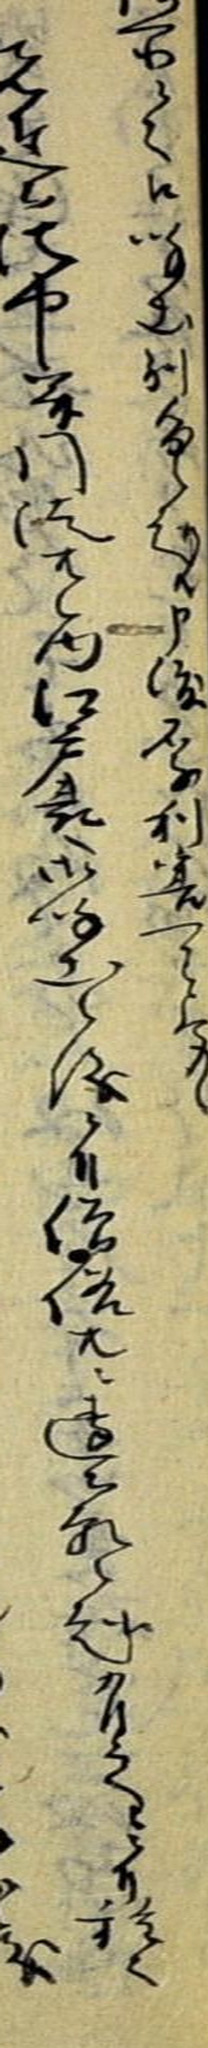先達而法中并門徒共之内江戸表へ御呼出之儀に付僧俗共に達而願之趣有之候に付種々
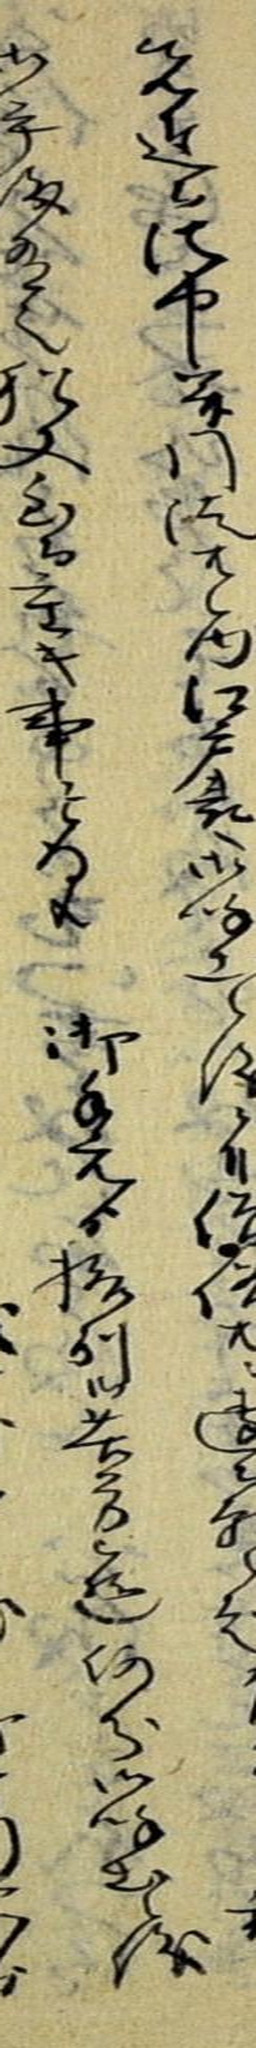御評議有之猶亦至而重キ事に候得共御手元ゟ格別御苦労被遊何分御呼出之儀
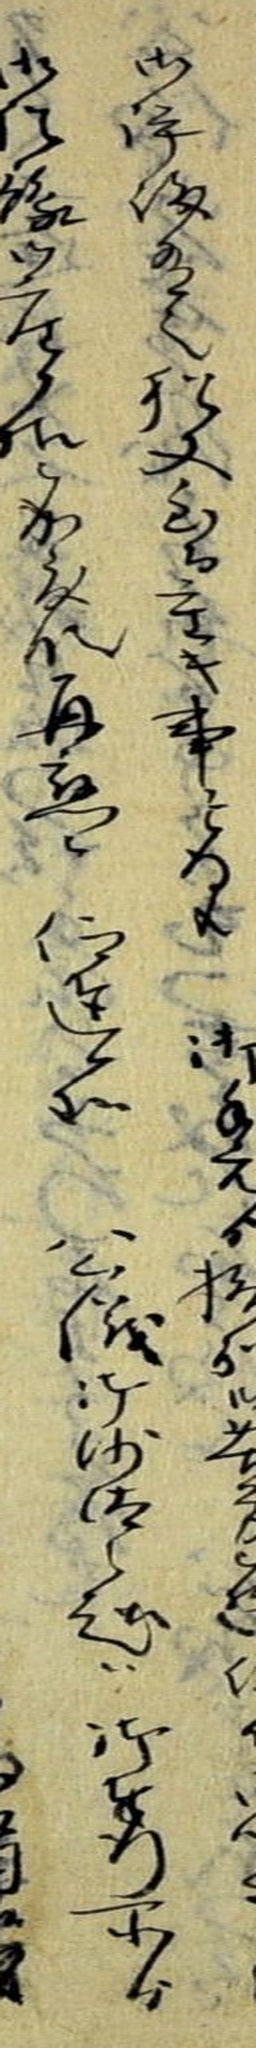御猶予御座候様被成度段再応被仰達候処公儀御沙汰之趣は御奉行所ゟ
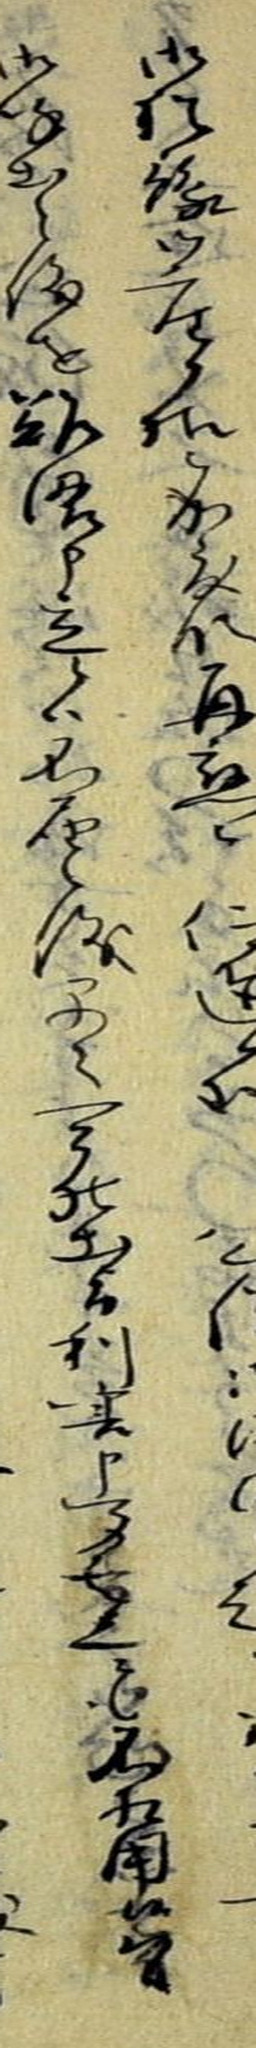御呼出之儀を難渋申立候は不届之儀早々可罷出旨利害申聞其上にも不相用候輩
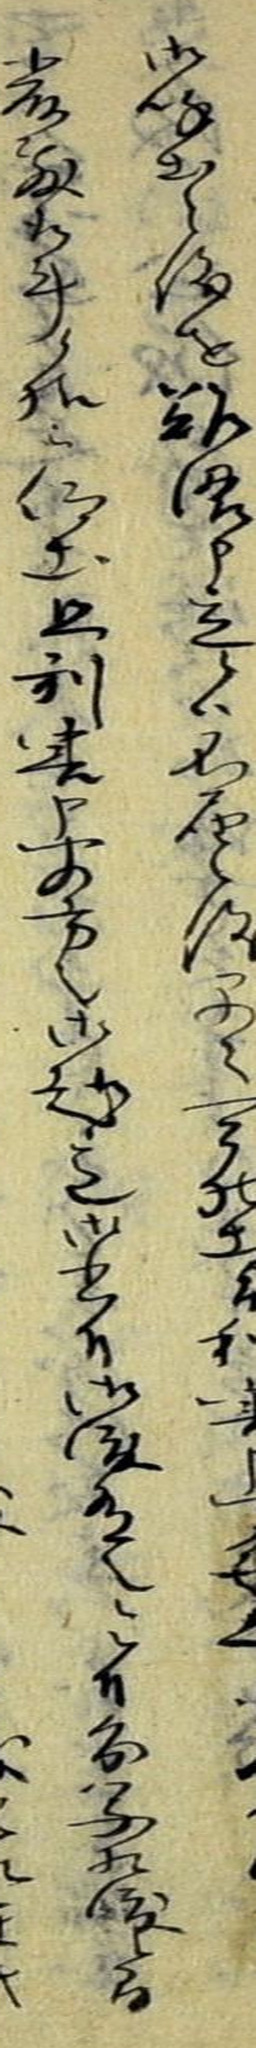厳敷取斗候様被仰出且利害申聞方之御趣意御書付御渡有之候に付則写相渡候間
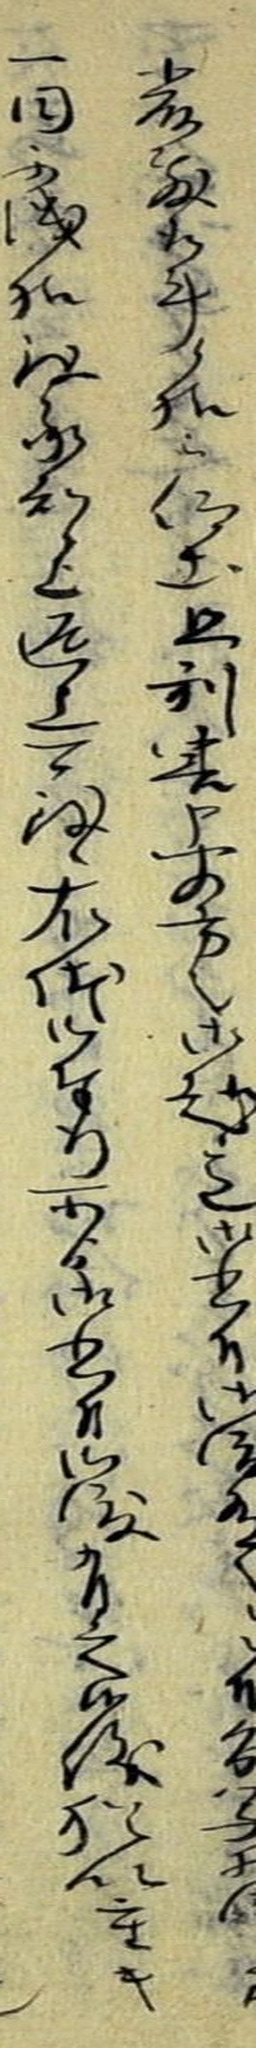一同不洩様致承知候上返上可致候右体御奉行所ゟ御書付御渡有之候儀猶以重キ
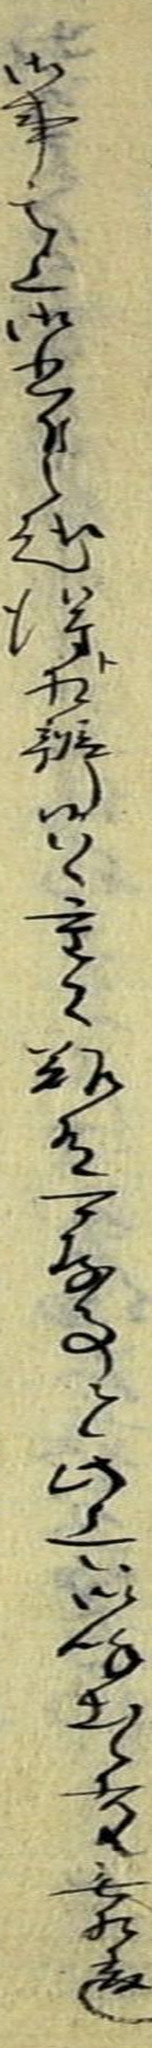御事其上御書付之趣得と相弁候はヽ重々難有可存事に候此上は御呼出之者共無相違
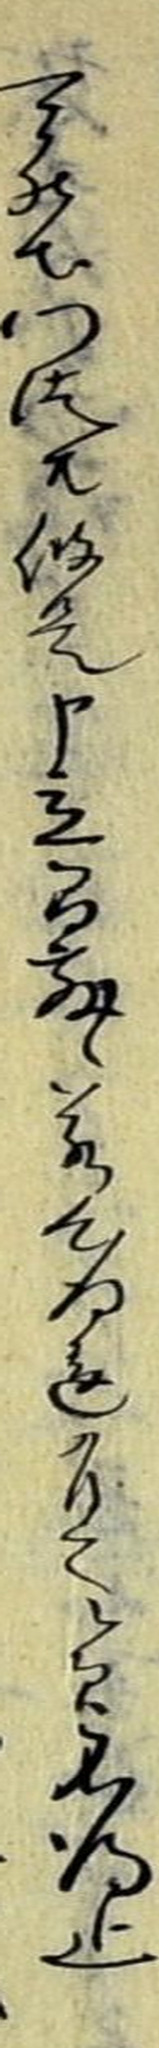可被罷出門徒共彼是申立間敷候若心得違有之候而は不得止
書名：命令之部 四
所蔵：福井県文書館 Fukui Prefectural Archives
